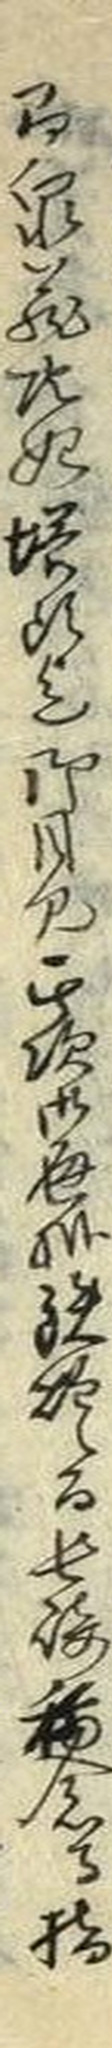間泉蔵院始塔頭迄御目見其次御通掛鉄炮之間長崎称念寺指
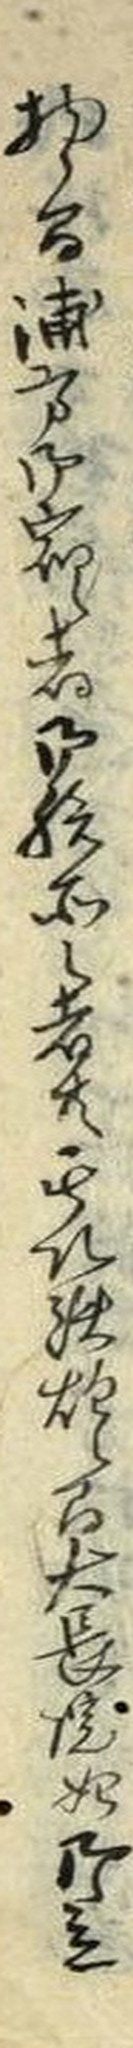物之間浦方御宿之者御膳所之者共其次鉄炮之間大長院始御立

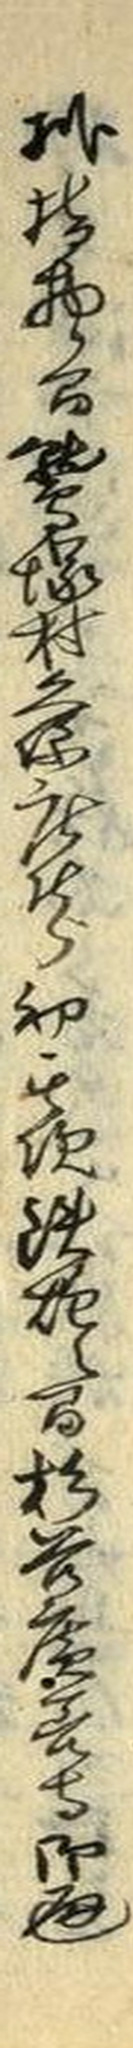掛指物之間鷲塚村久保庄次郎初其次鉄炮之間杉谷広善寺御通
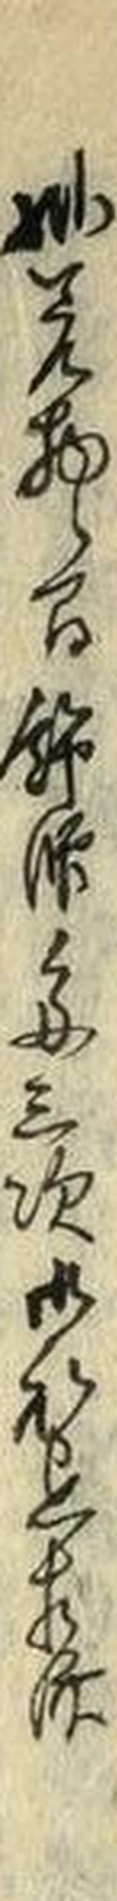掛差物之間飾師多三次御礼申上相済
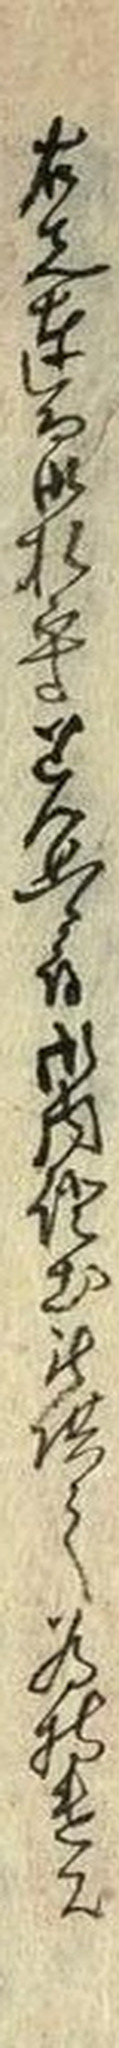右先達而御札守差上候ニ付御内証出被供之為持遣ス
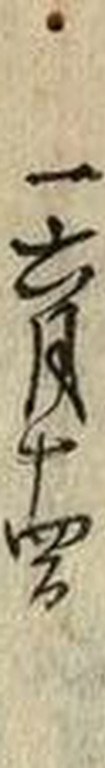一六月十四日
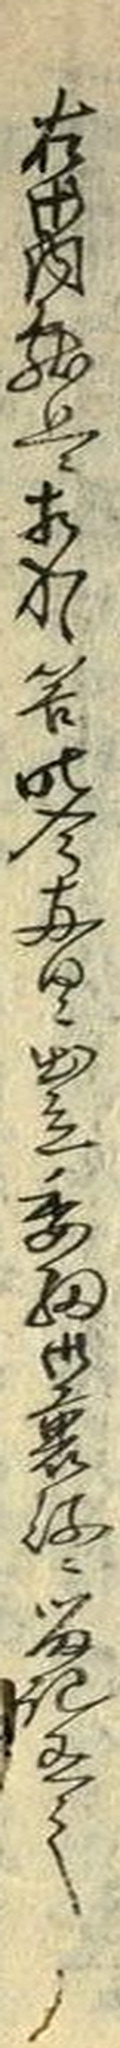右御内献上ニ相成候筈昨今両日ニ出立委細御裏役ニ留記有之
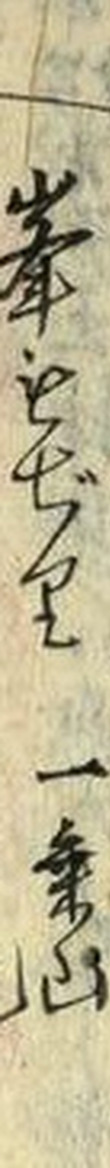峯もぢり一乗山
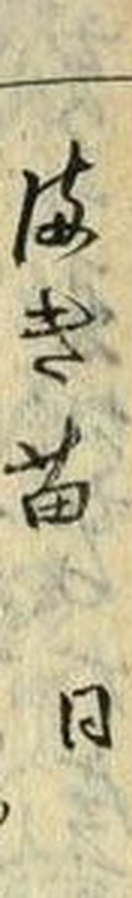まき苗同
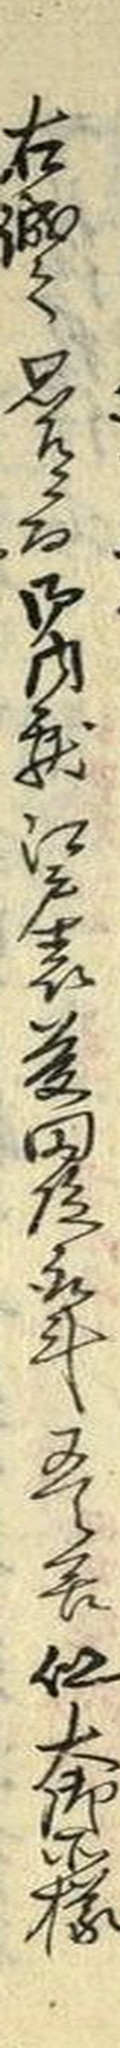右誠之思召ニ而御内献江戸表藤田殿取斗有之筈但大御所様
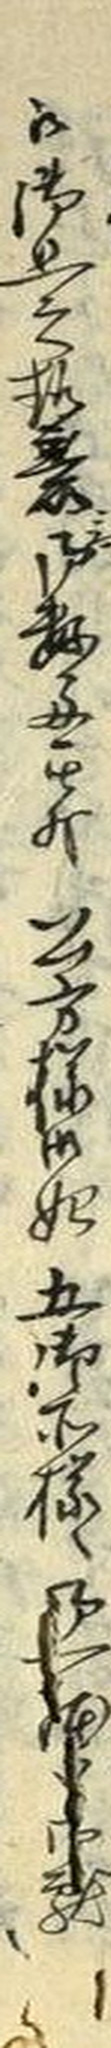江御上之趣意ニ而御数多其外公方様御始五御所様へ御一鉢ツヽ御献
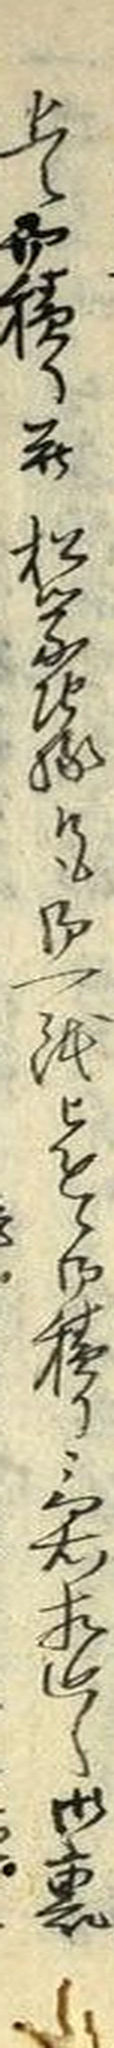上之御積り并松栄院様江も御一鉢被進候御積りニ而相廻し御裏
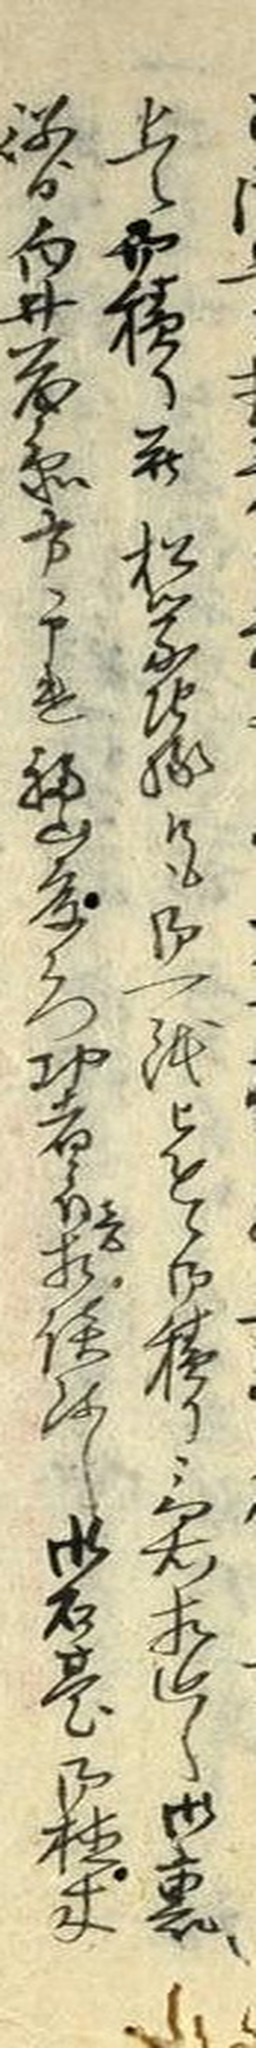役ゟ白井茂兵衛方へ申遣福山藤右衛門功者ニ付旁相談致し御石台御植木
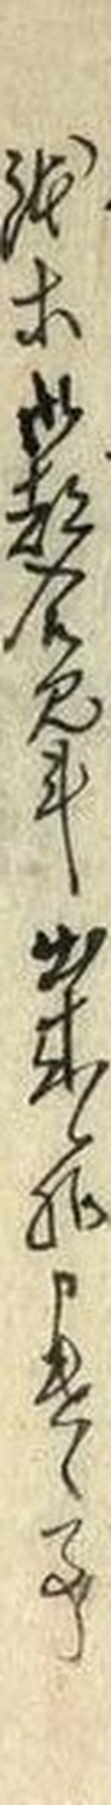鉢等御都合見斗出来候様申遣候事
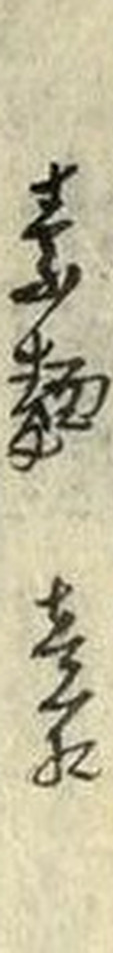素麺壱箱
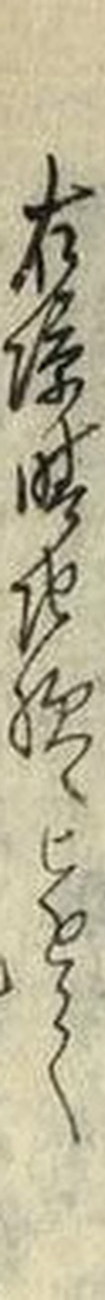右涼晴院様へ被進之
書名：少傅日録抄（斉善付側向頭取日記、江戸并道中、初入在国、逝去後…
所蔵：福井県文書館 Fukui Prefectural Archives
